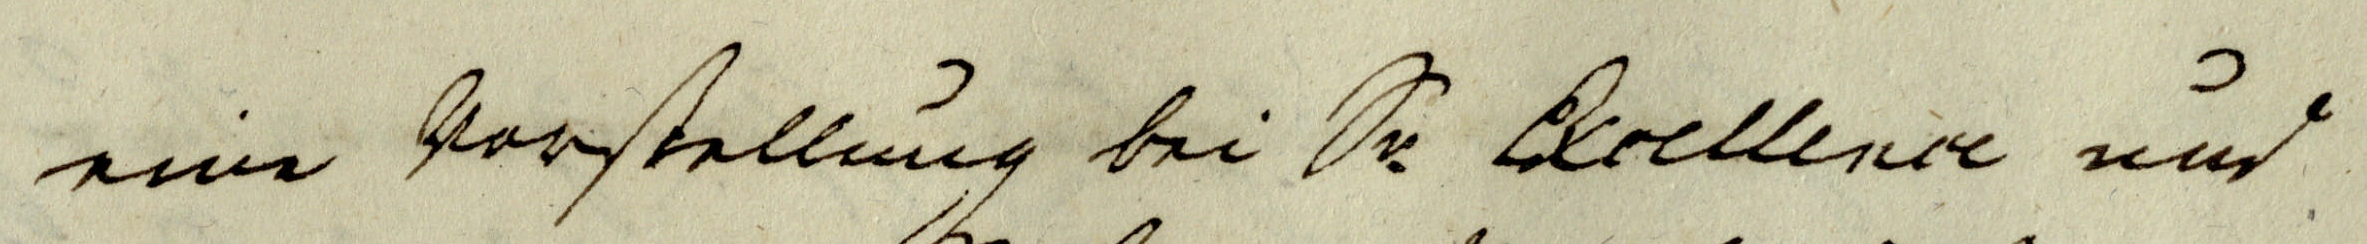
eine Vorstellung bei Sr Excellence und
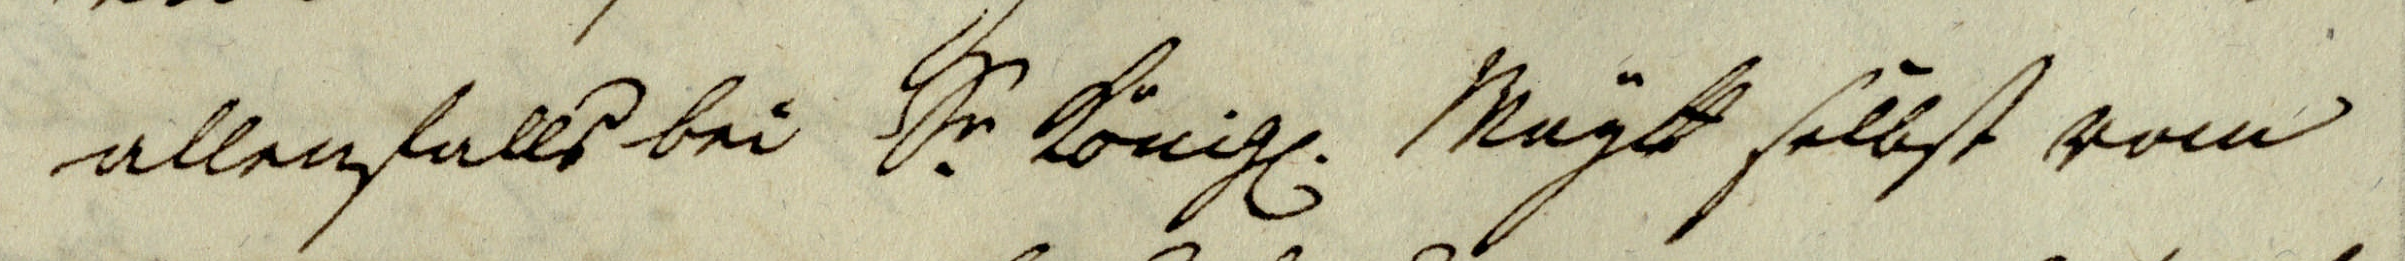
allenfalls bei Sr Königl. Maÿtt selbst vom
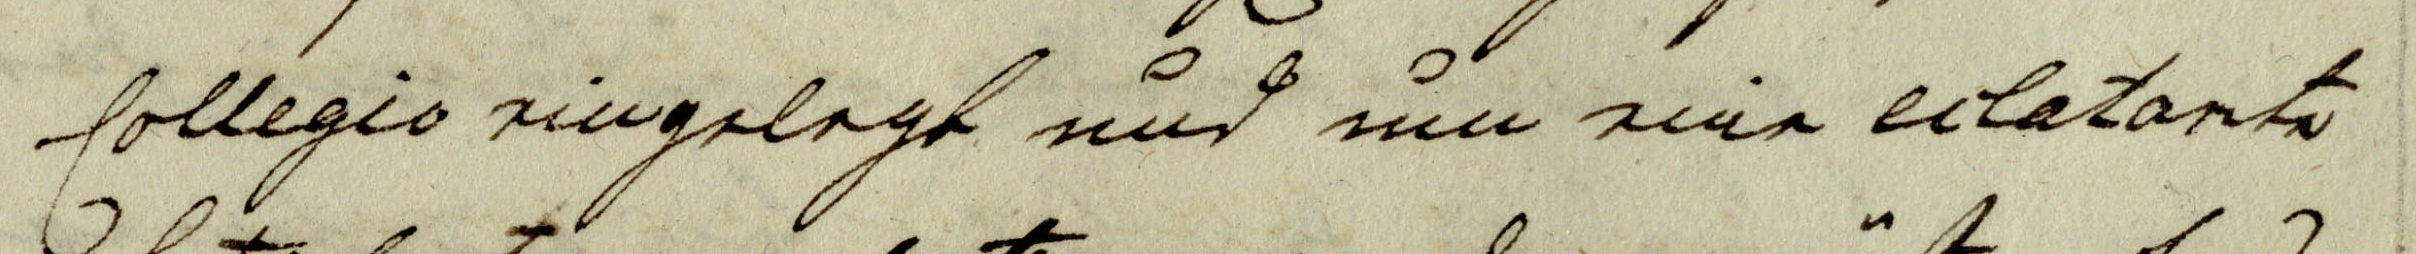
Collegio eingelegt und um eine eclatante
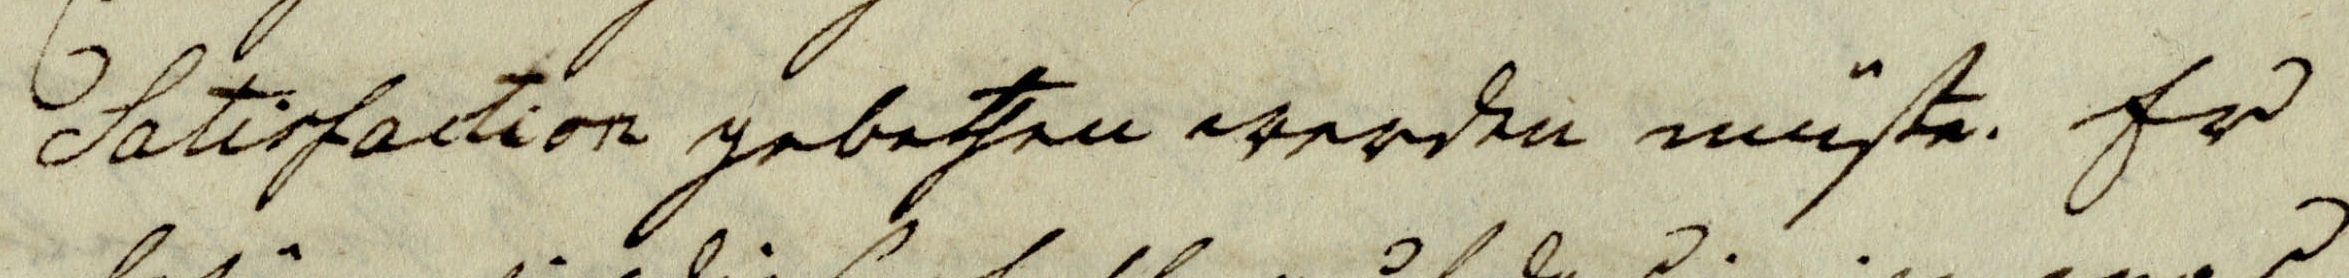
Satisfaction gebethen werden müßte. Er
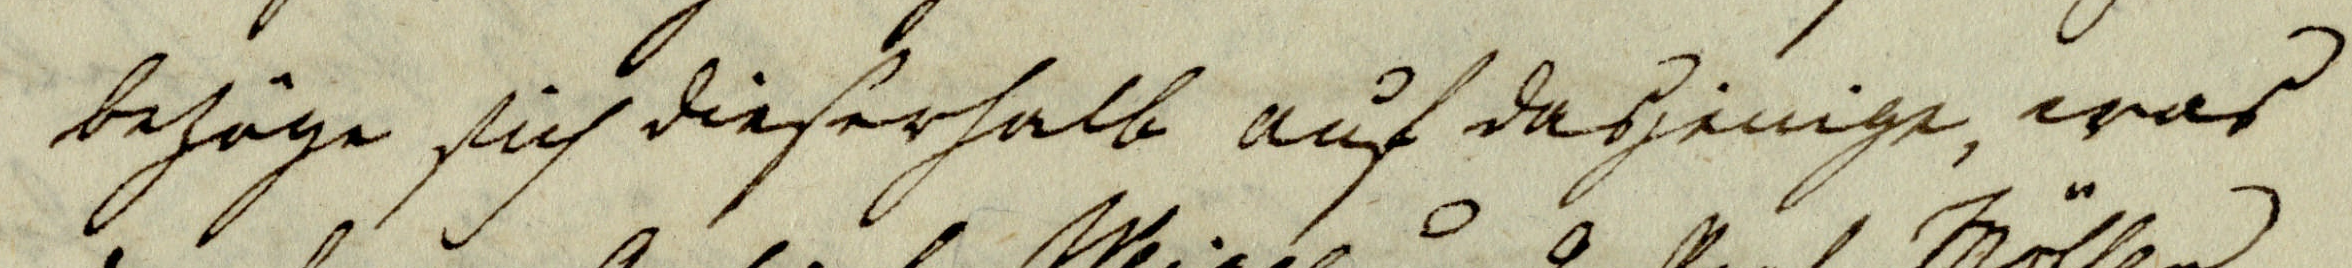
bezöge sich dieserhalb auf dasjenige, was
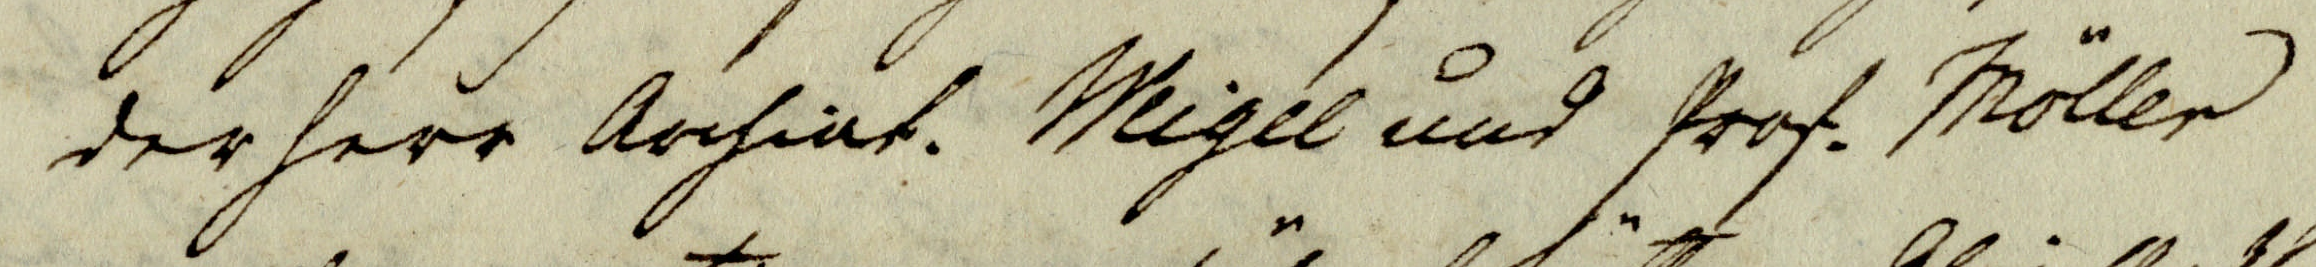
der Herr Archiat. Weigel und Prof. Möller
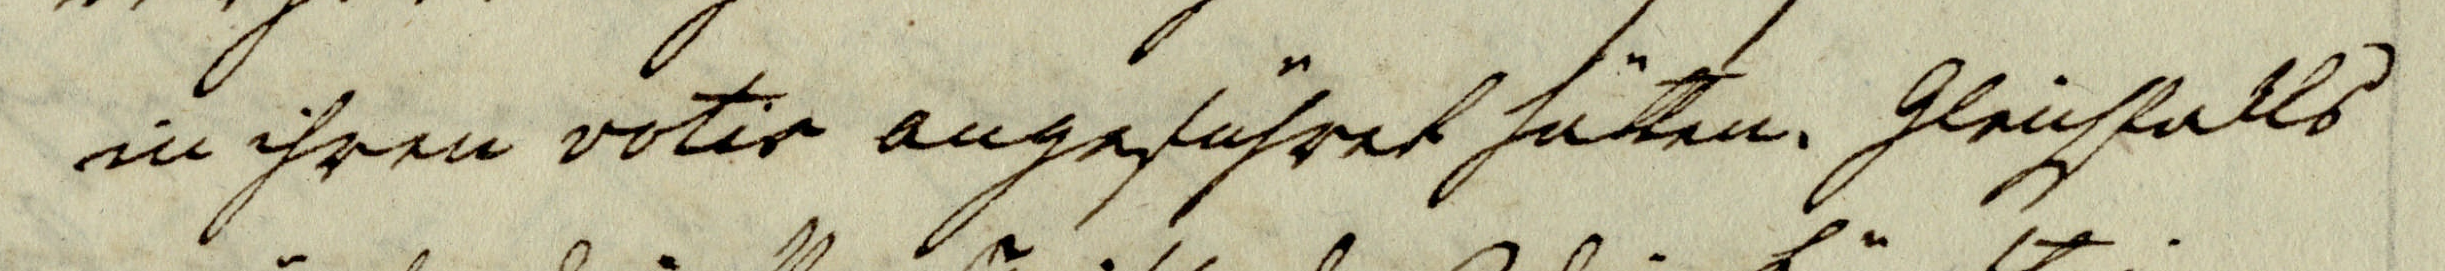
in ihren votis angeführet hätten. Gleichfalls
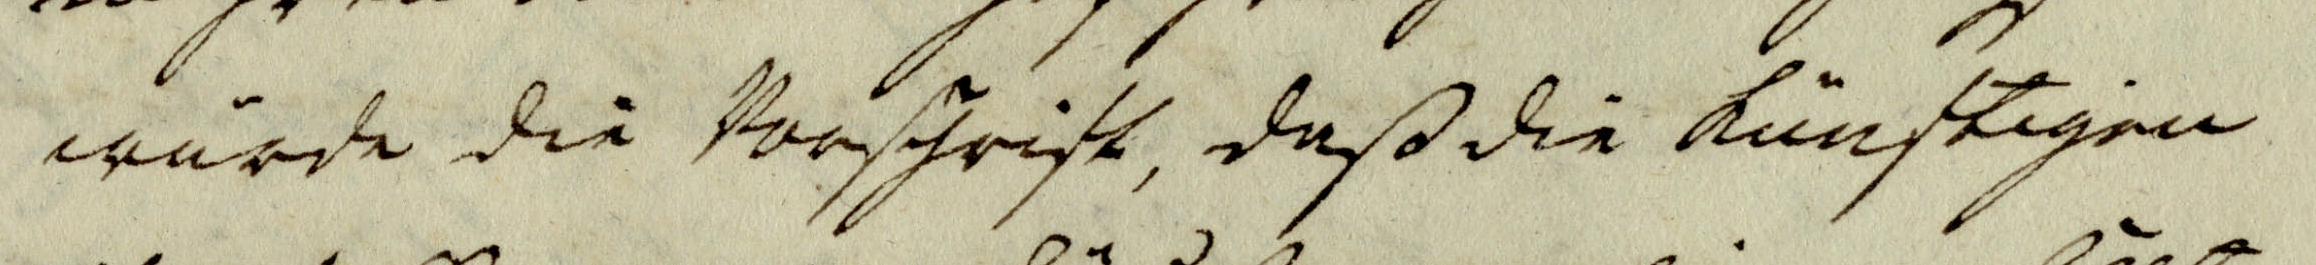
würde die Vorschrift, daß die künftigen
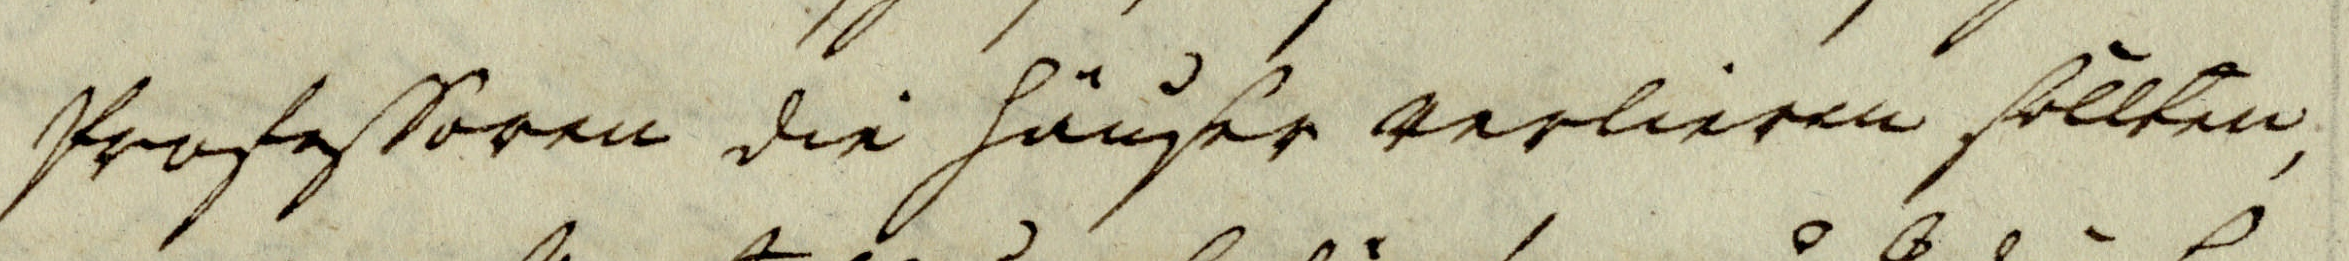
Professoren die Häuser verlieren sollten,
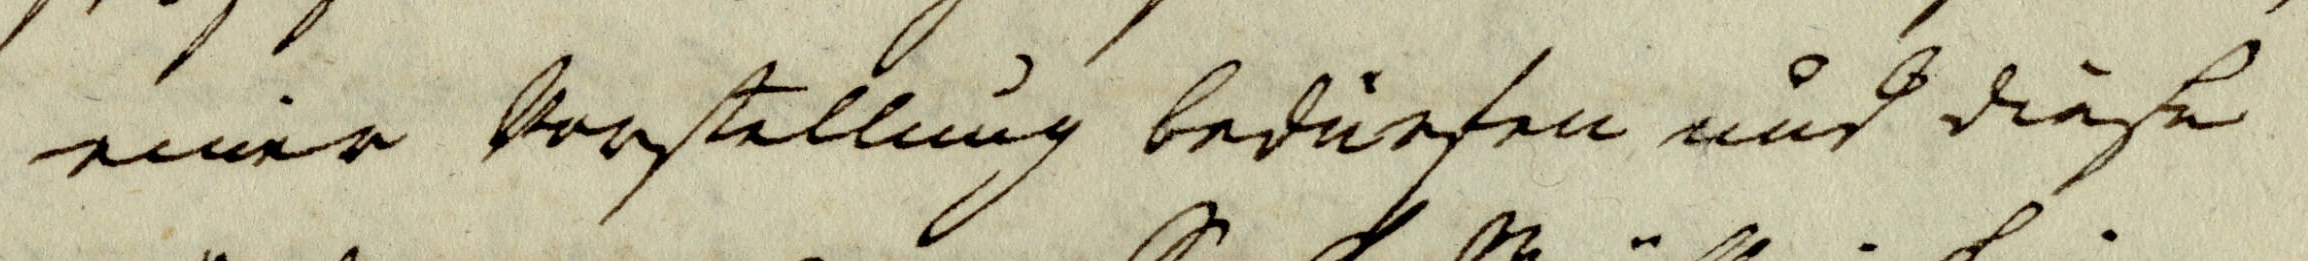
einer Vorstellung bedürfen und diese
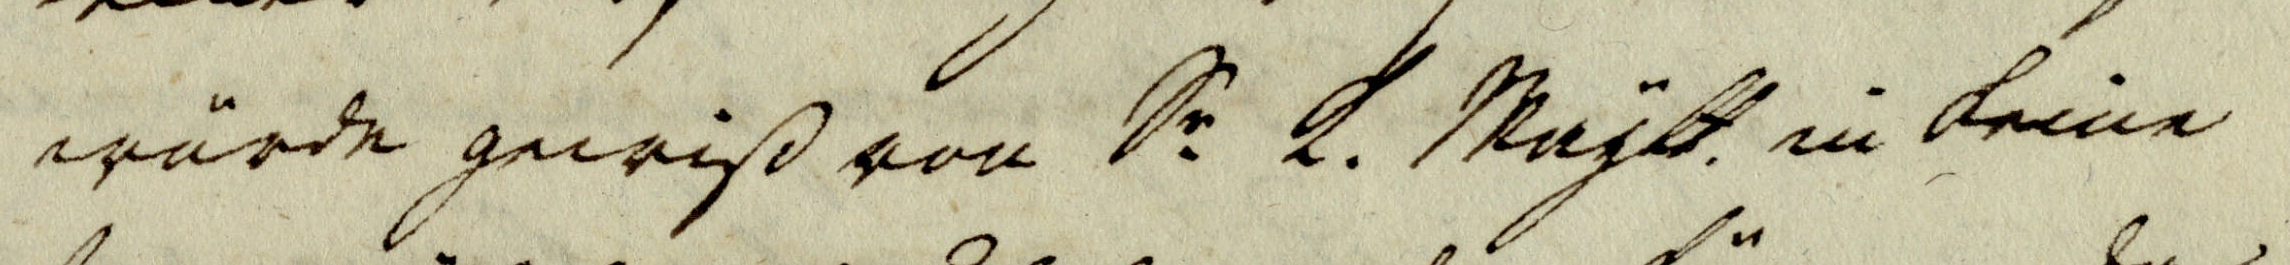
würde gewiß von Sr K. Maÿtt. in keine
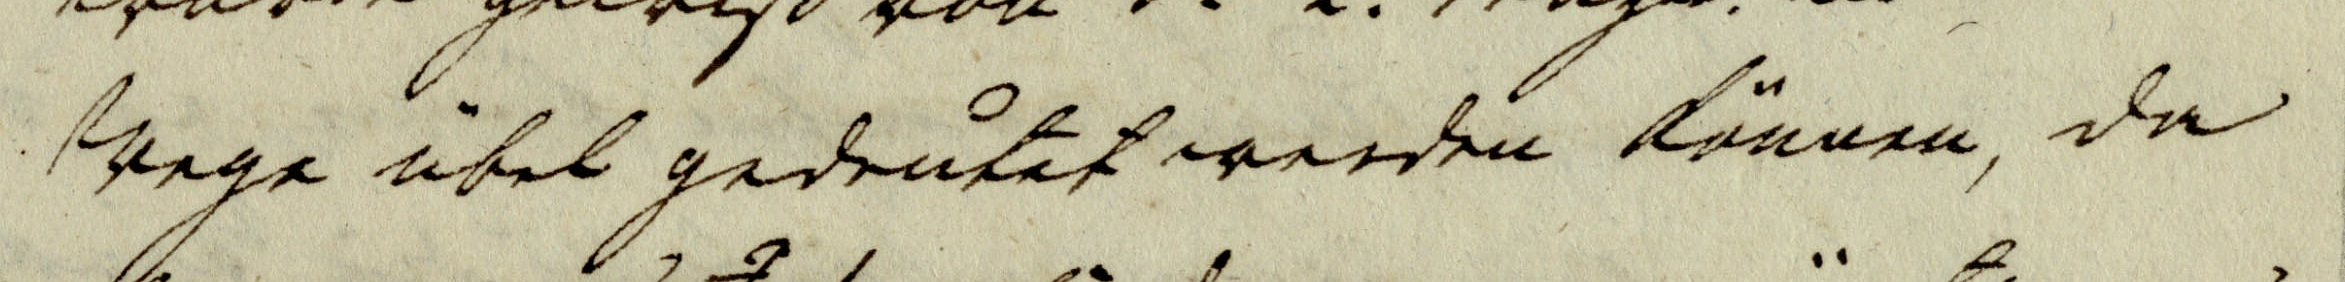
Wege übel gedeutet werden können, da
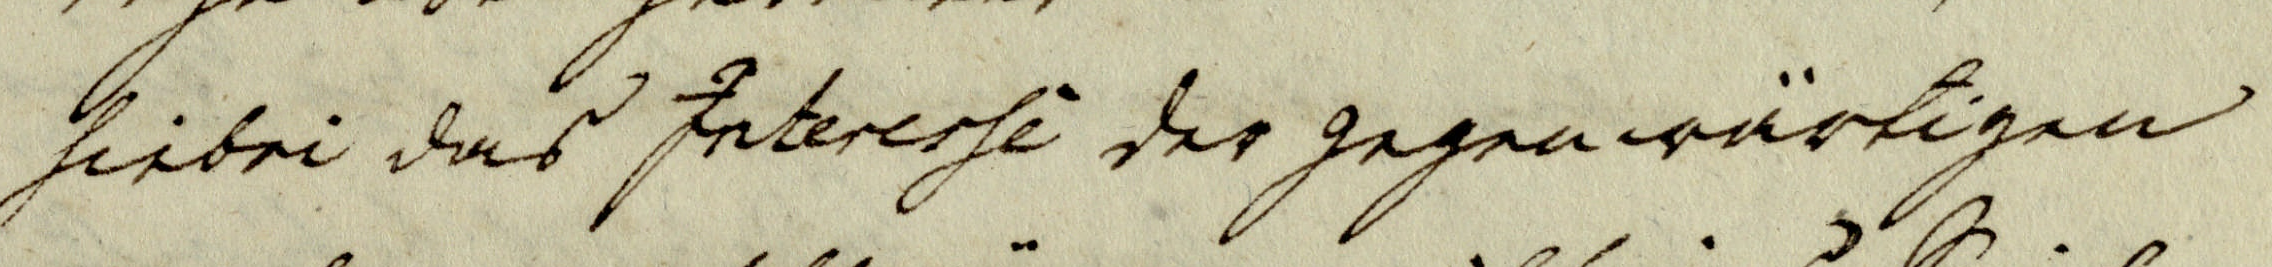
hiebei das Interesse der gegenwärtigen
